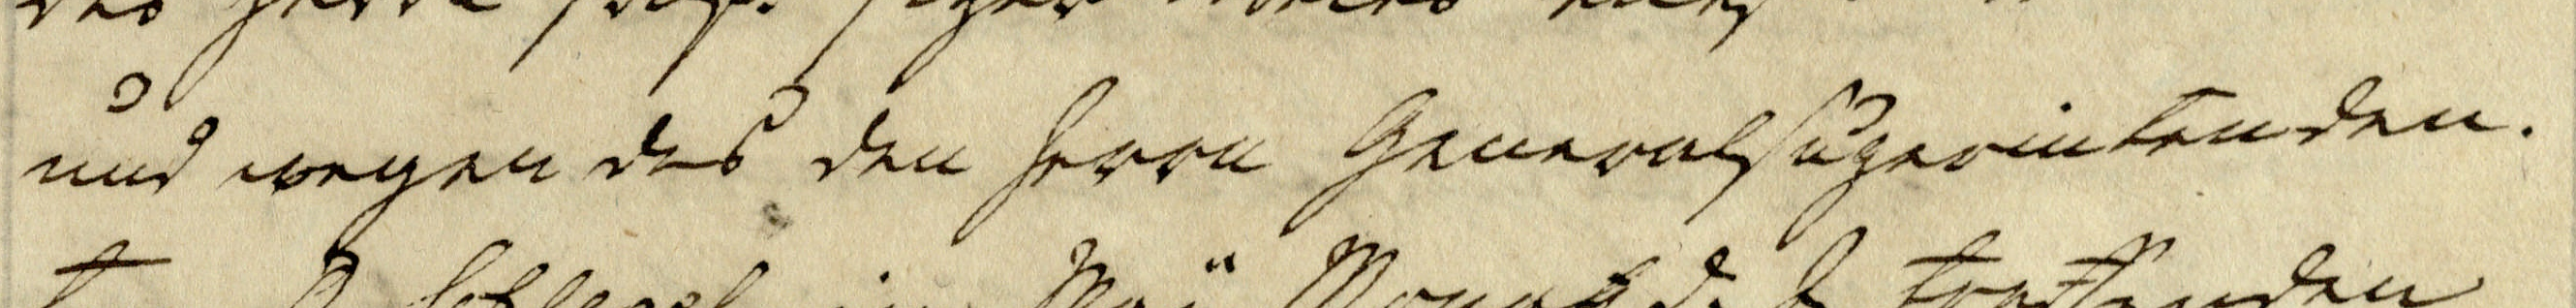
und wegen des den Herrn Generalsuperintenden¬
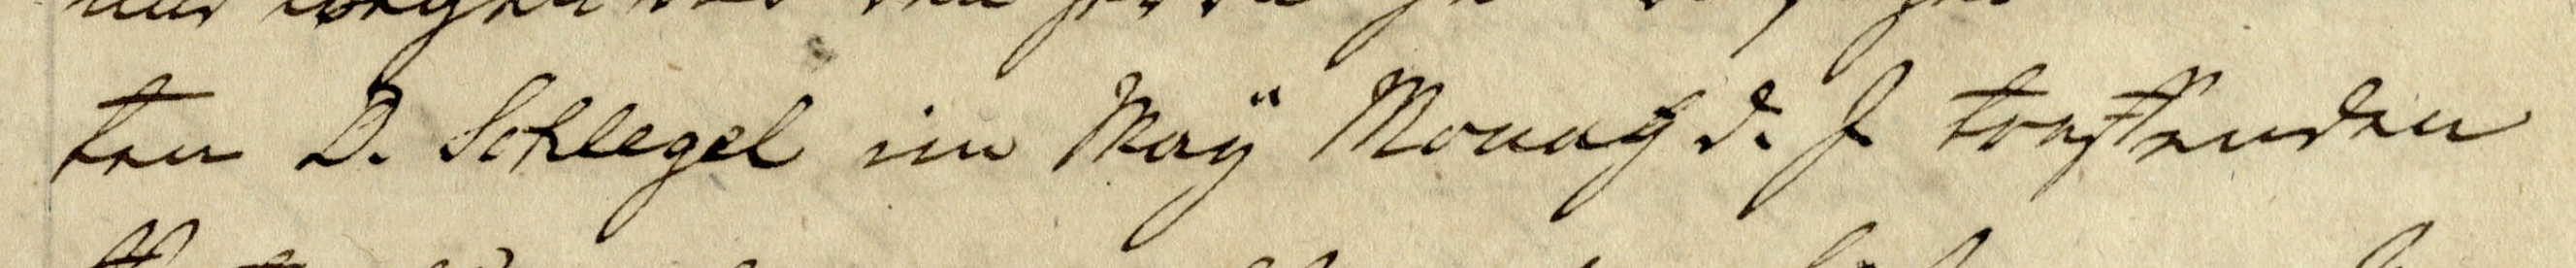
ten D. Schlegel im Maÿ Monath d. J. treffenden
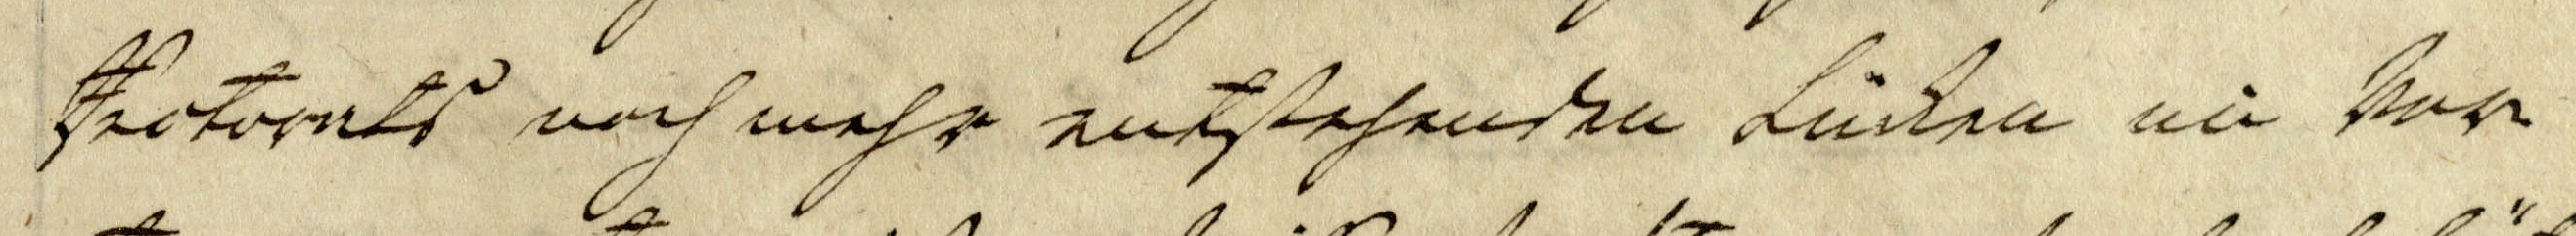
Rectorats noch mehr entstehenden Lücken in Vor¬
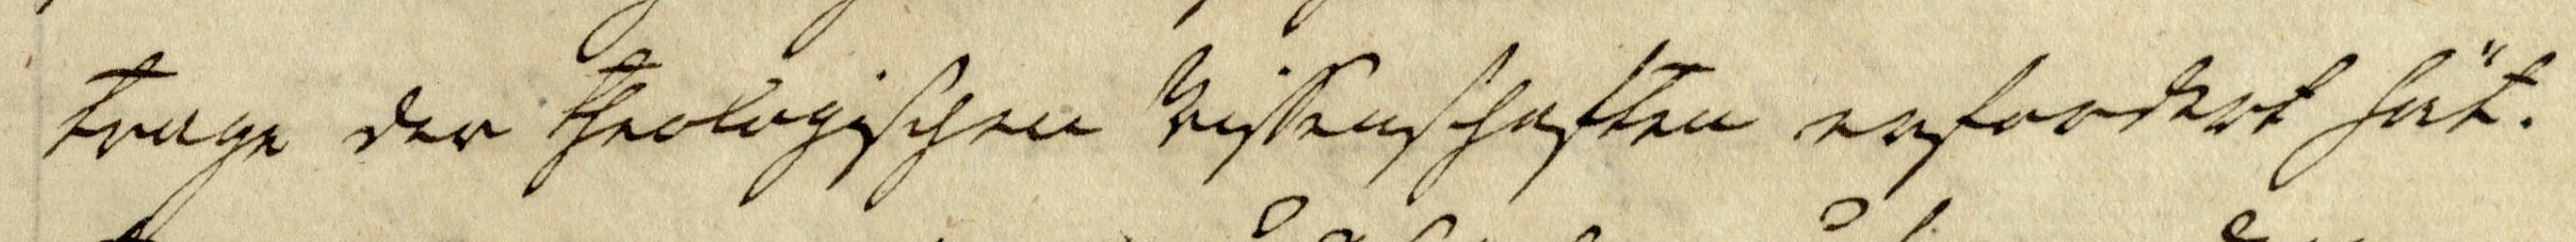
trage der Theologischen Wissenschaften erfordert hät¬
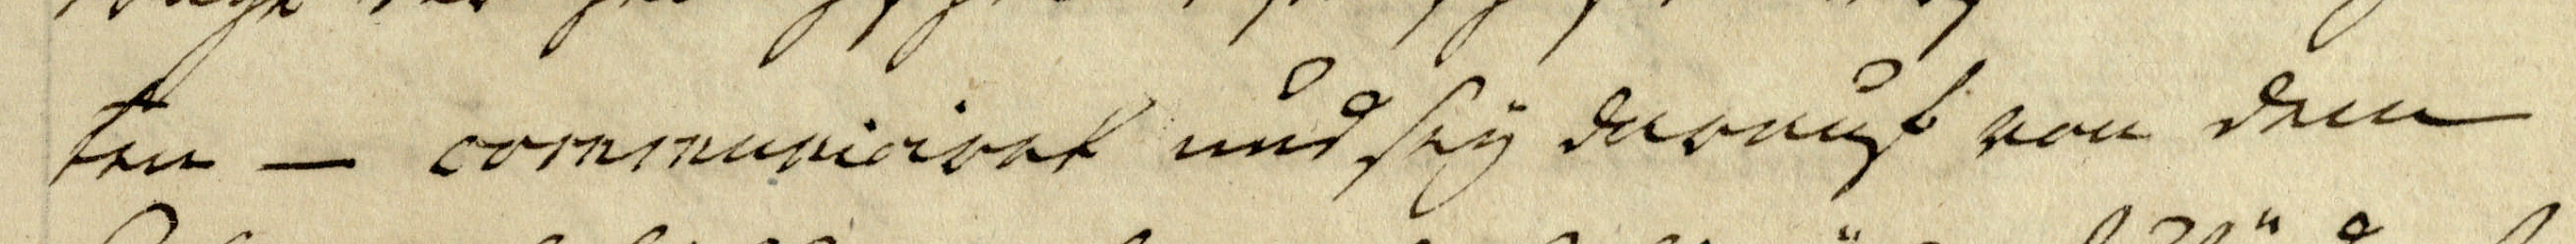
ten communiciret und seÿ darauf vom dem
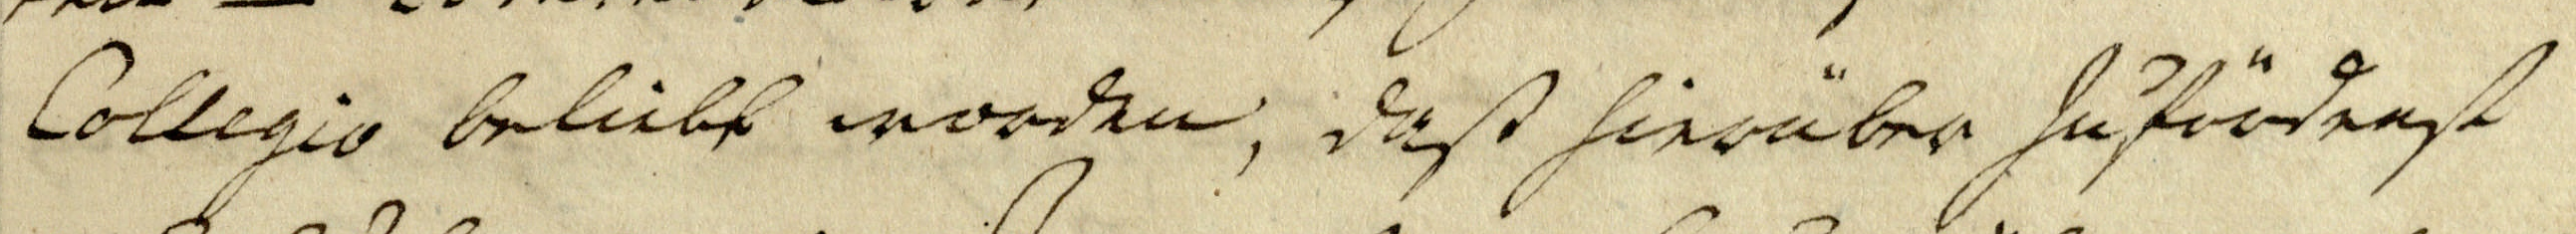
Collegio beliebt worden, daß hierüber zuförderst
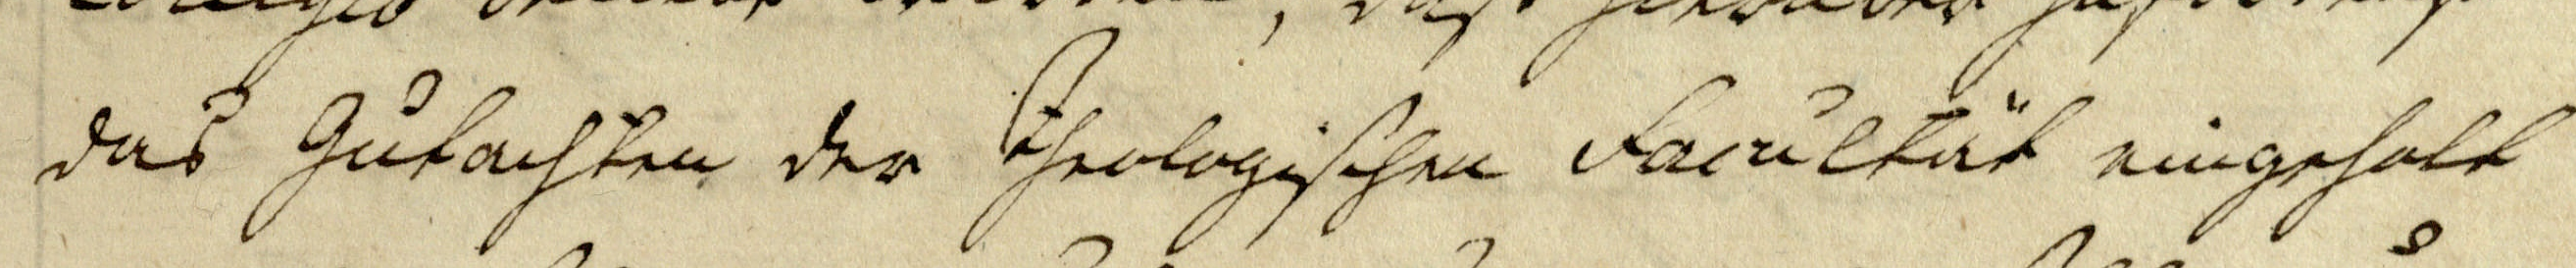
das Gutachten der Theologischen Facultat eingeholt
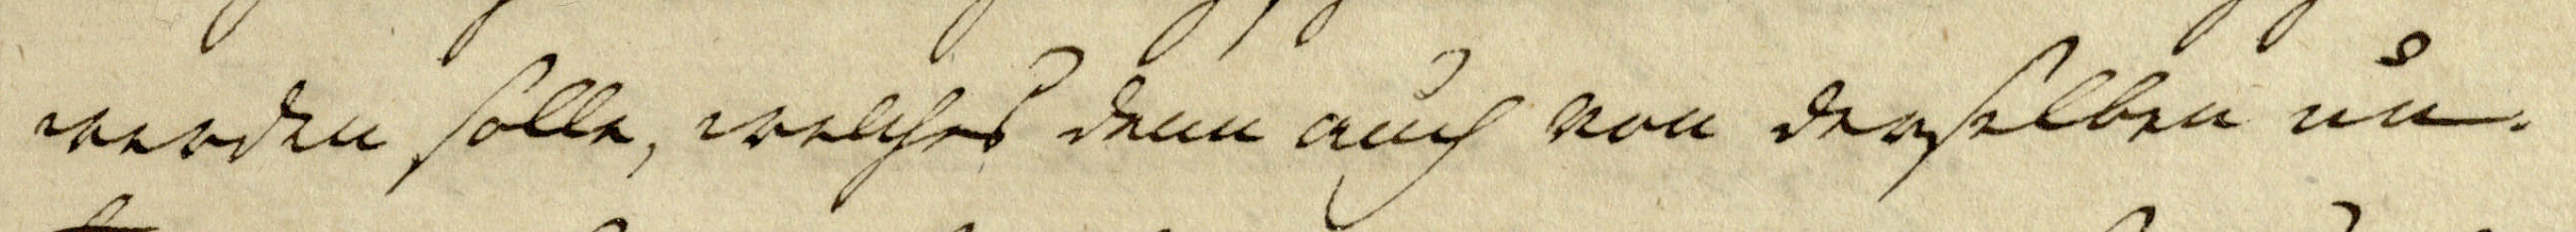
werden solle, welches den auch von derselben un¬
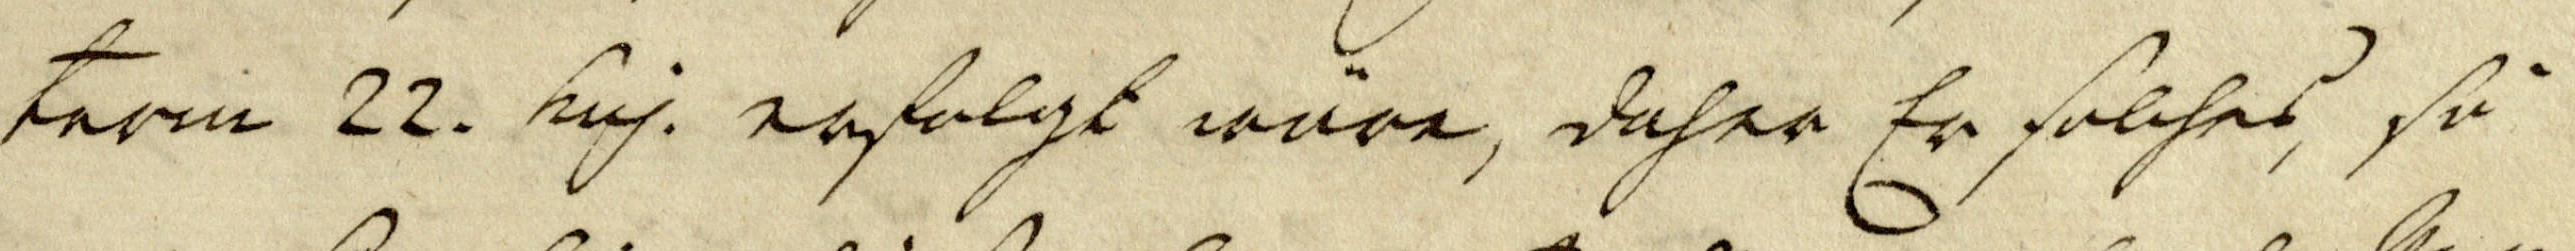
term 22. huj. erfolgt wäre, daher Er solches, so
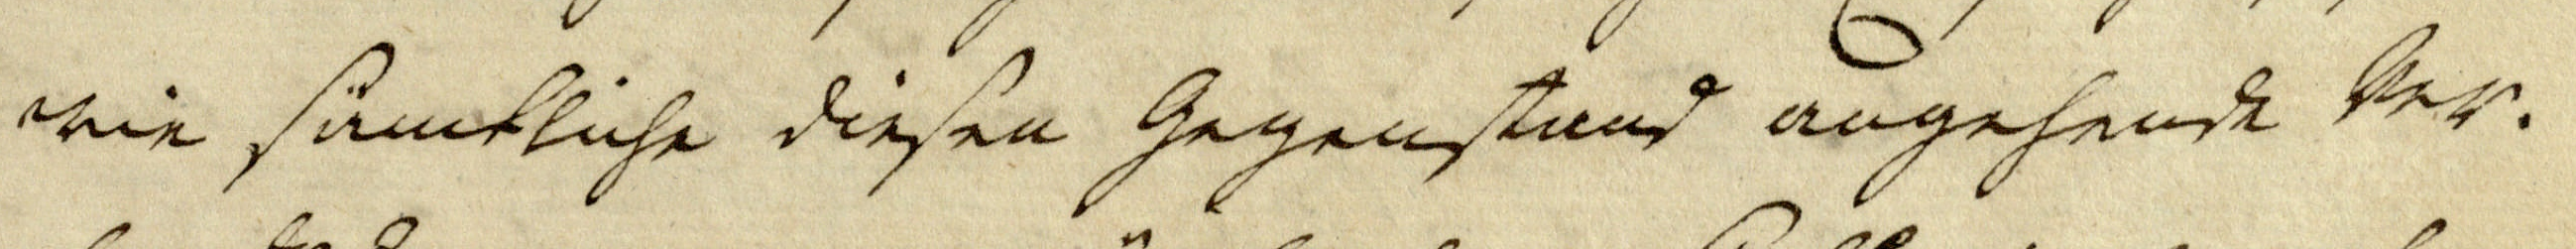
wie sämtliche diesen Gegenstand angehende Ver¬
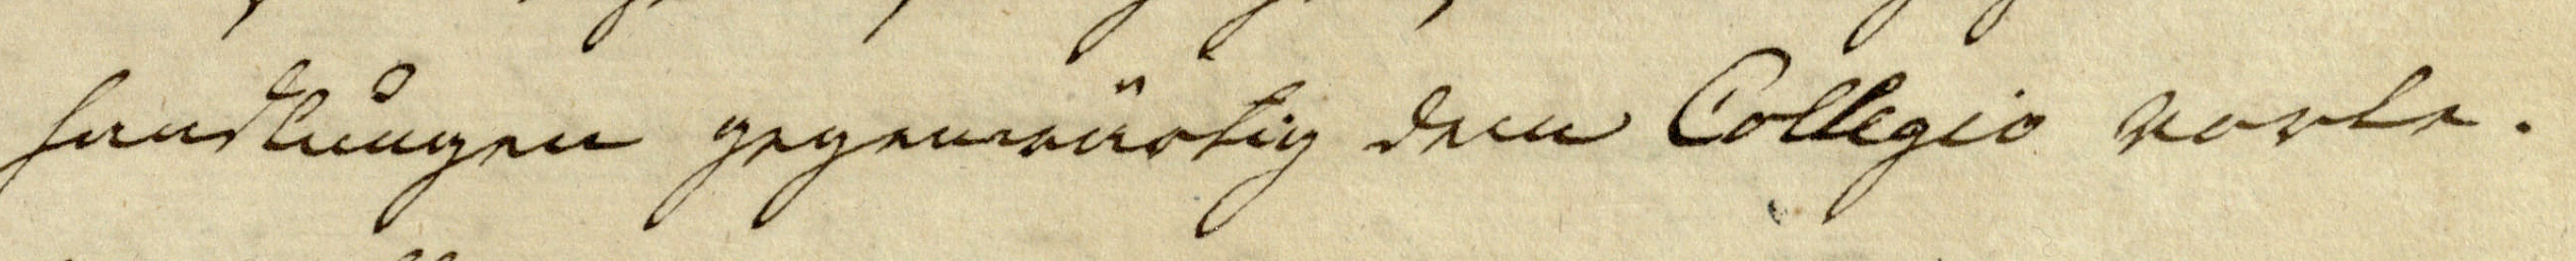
handlungen gegenwärtig dem Collegio vorle¬
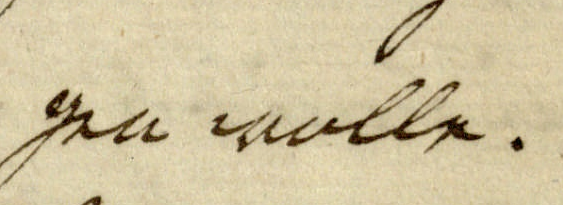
gen wolle.
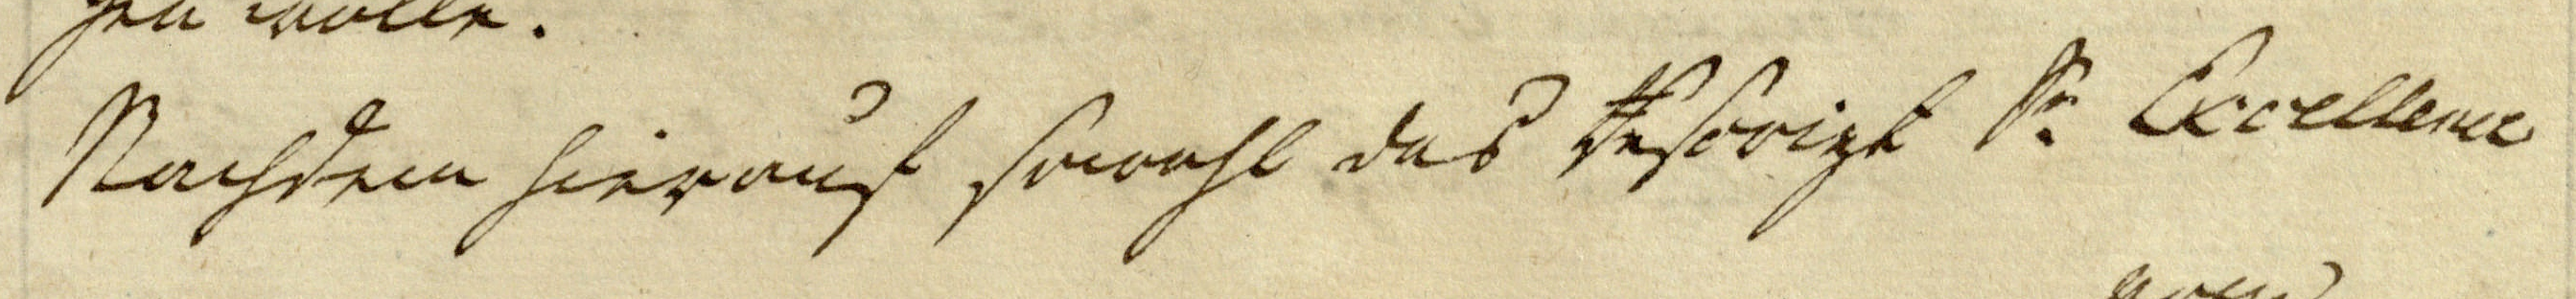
Nachdem hierauf sowohl das Rescripts Sr. Excellence
